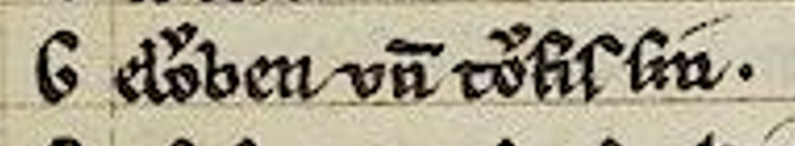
Gelo°vben vn(d) to°vfiſ ſin.
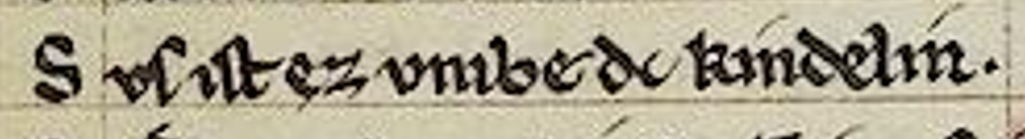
Svſ iſt ez vmbe d(az) kindelin.
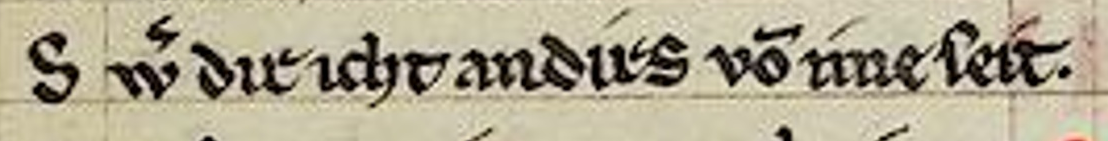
Sw(er) dir icht andirs vo(n) ime ſeit.
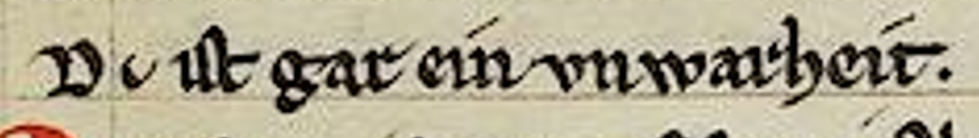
D(az) iſt gar ein vnwarheit.
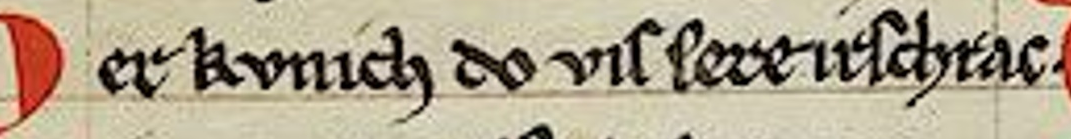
*Der kvnich do vil ſere irſchrac.
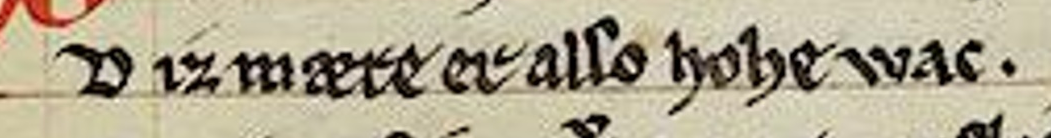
Diz m[ae]re er alſo hohe wac.
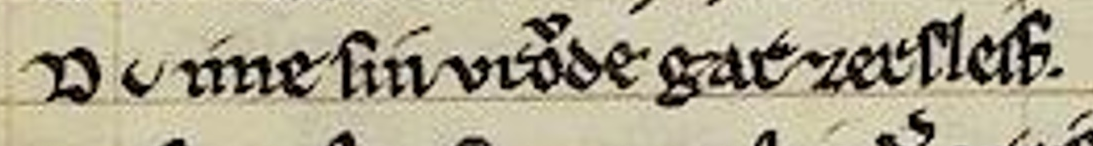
D(az) ime ſin vro°vde gar zerſleif.
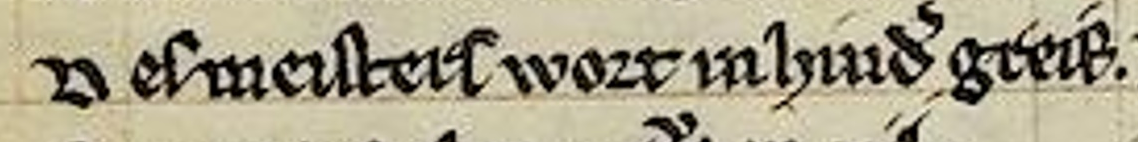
Deſ meiſterſ wort in hind(er) greif.
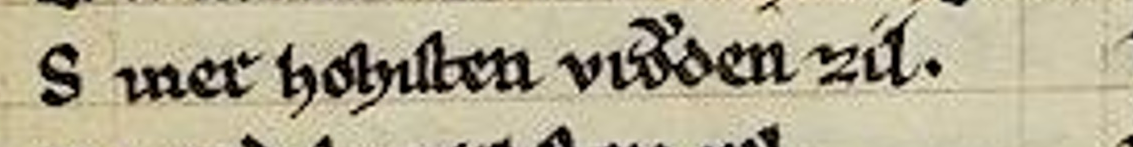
Siner hohiſten vro°vden zil.
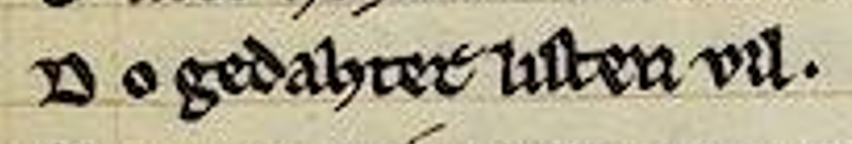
Do gedahter liſten vil.
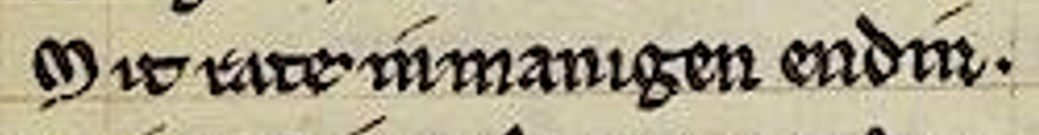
Mit rate in manigen endin.
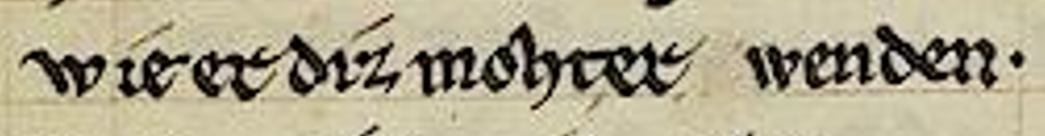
Wie er diz mohter wenden.
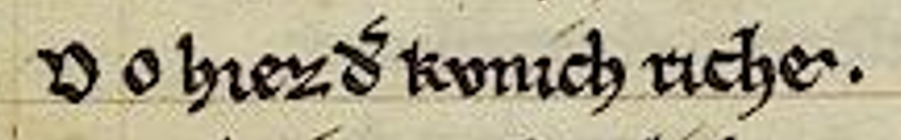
Do hiez d(er) kvnich riche.
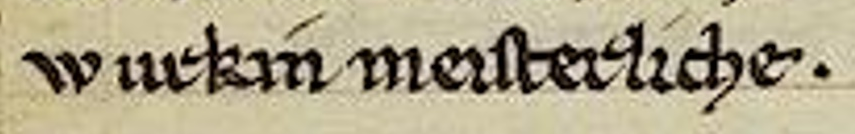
wurkin meiſterliche.
